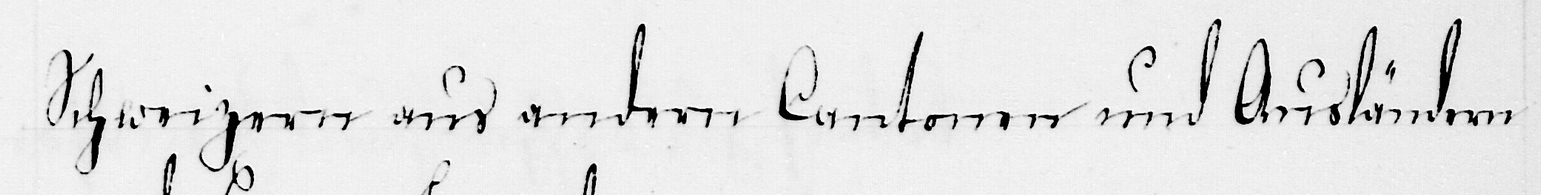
Schweizern aus andern Cantonen und Ausländern
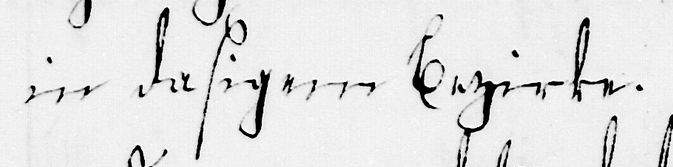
in dasigem Bezirke.
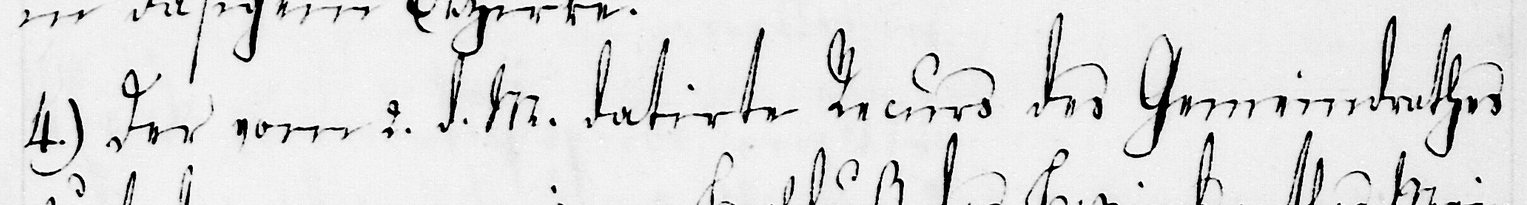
4.) Der vom 2. d. M. datirte Recurs des Gemeindrathes
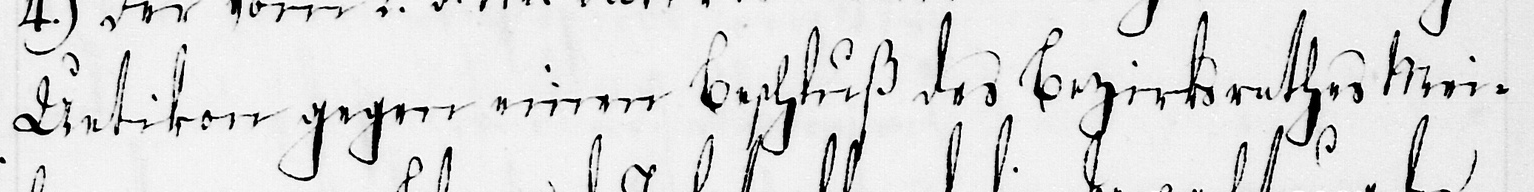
Uetikon gegen einen Beschluß des Bezirksrathes Mei¬
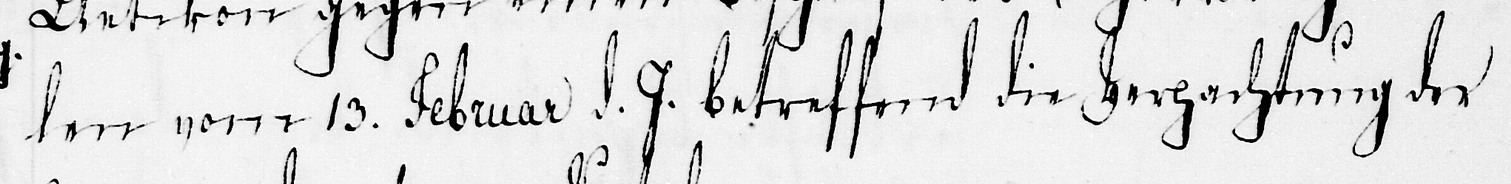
len vom 13. Februar d. J. betreffend die Verpachtung der
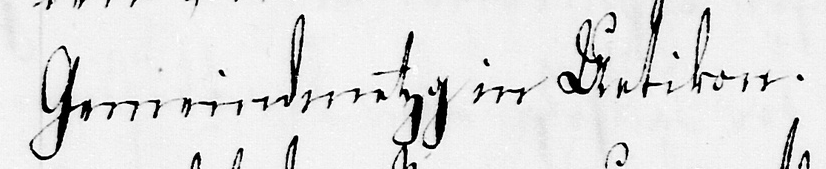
Gemeindmetzg in Uetikon.
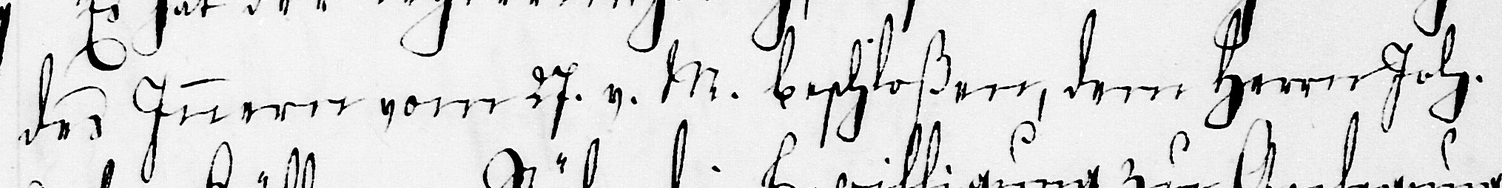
des Innern vom 27. v. M. beschloßen, dem Herrn Joh.
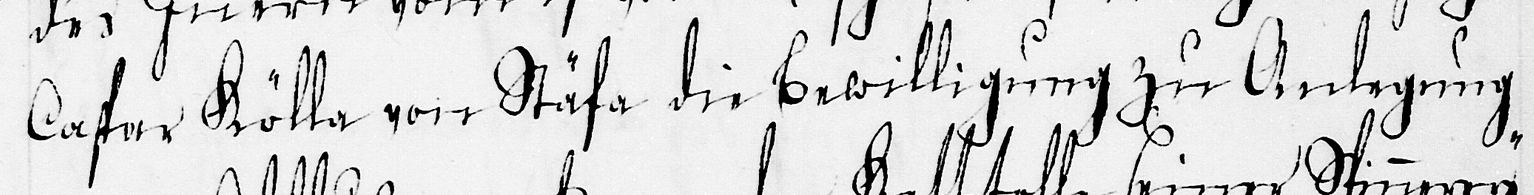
Caspar Kölla von Stäfa die Bewilligung zu Anlegung
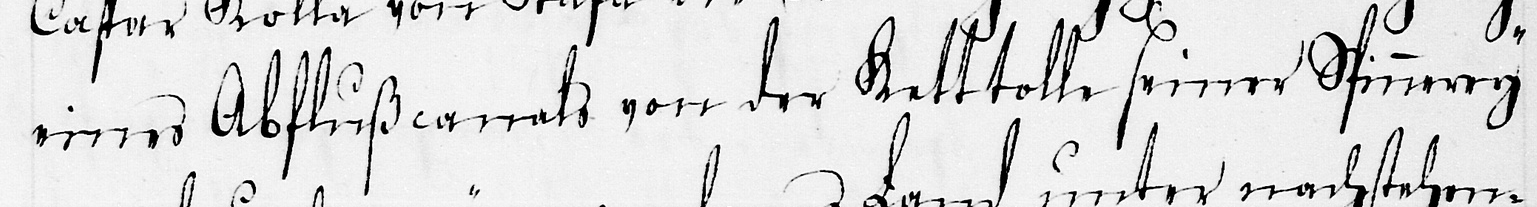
eines Abflußcanals von der Ketttolle seiner Spinnerey
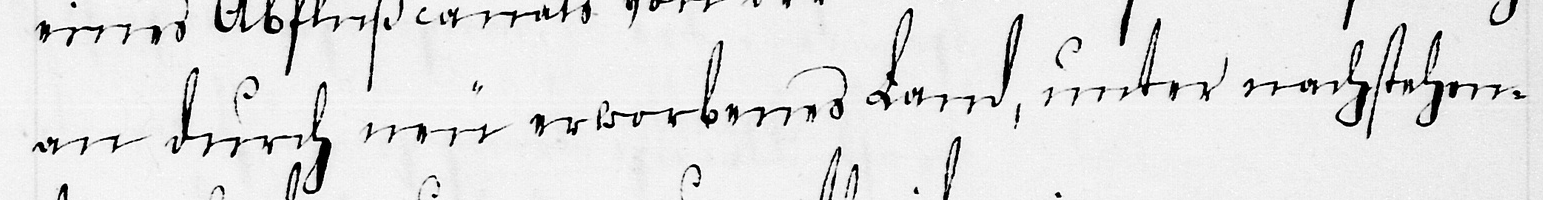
an durch neu erworbenes Land, unter nachstehen¬
